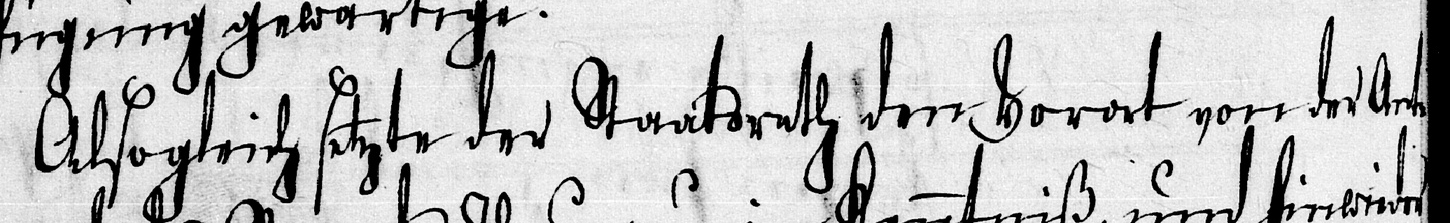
Alsogleich setzte der Staatsrath den Vorort von der Ant¬
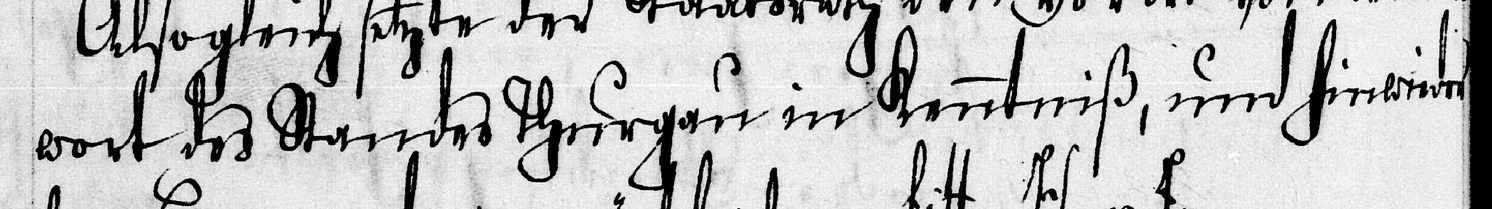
wort des Standes Thurgau in Kenntniß, und hinwieder
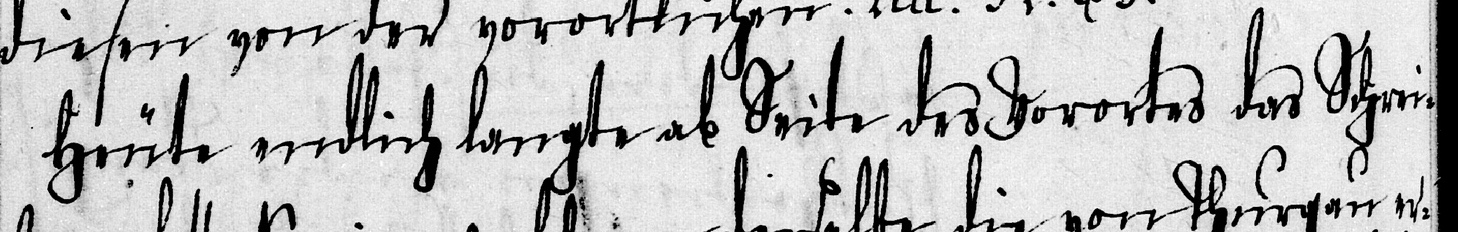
Heute endlich langte ab Seite des Vorortes das Schre¬
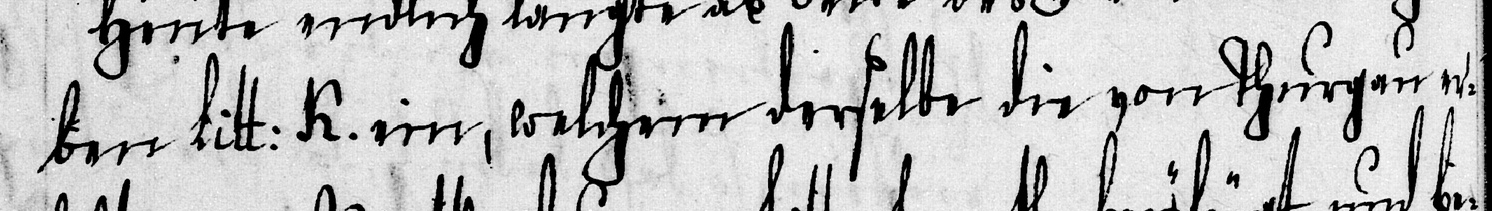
iben Litt: K. ein, welchem derselbe die von Thurgau e¬
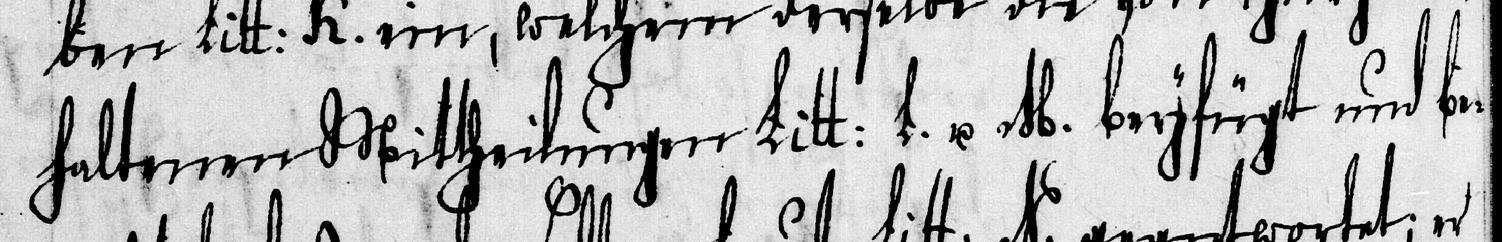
rhaltenen Mittheilungen Litt: L. u. M. beyfügt und
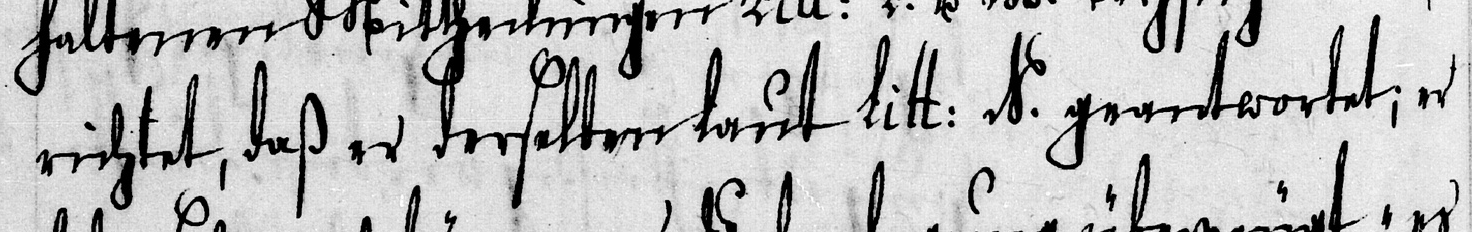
richtet, daß er derselben laut Litt: N. geantwortet; er
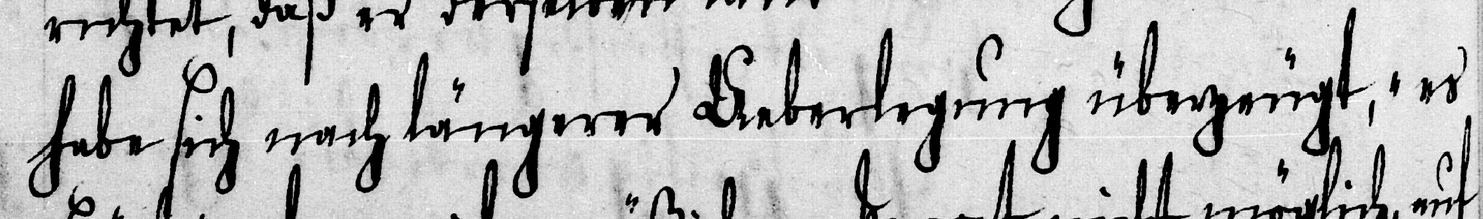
habe sich nach längerer Ueberlegung überzeugt, „es
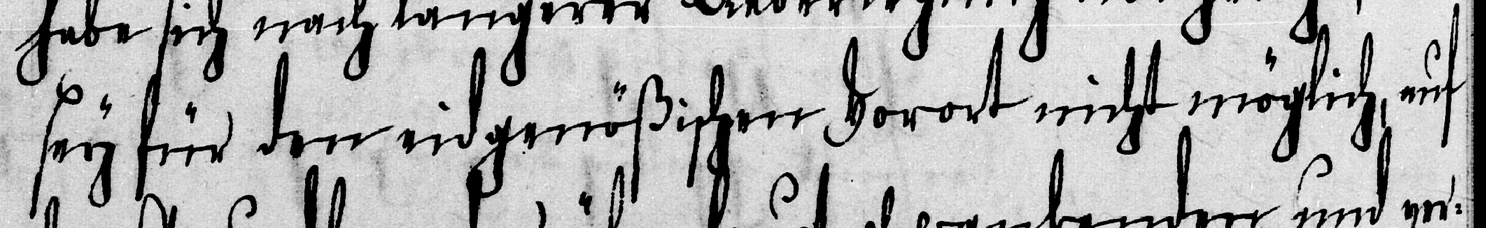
sey für den eidgenößischen Vorort nicht möglich, auf
